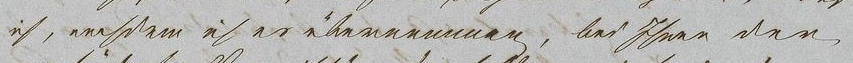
ich, nachdem ich es übernommen, bei Ihnen der
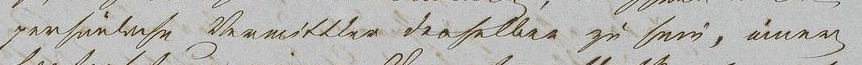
persönliche Vermittler desselben zu sein, einer
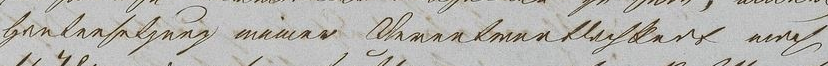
Hintansetzung meiner Verantwortlichkeit mich
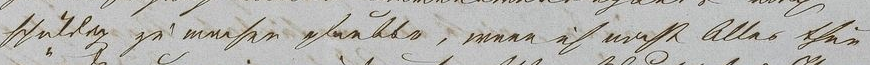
schuldig zu machen glaubte, wenn ich nicht Alles thun
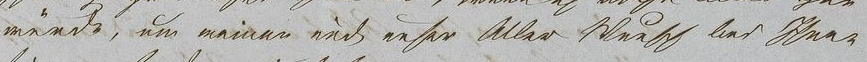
würde, um meinen und unser Aller Wunsch bei Ihnen
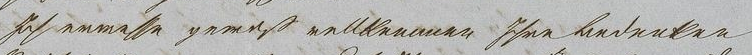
Ich ermesse gewiß vollkommen Ihre Bedenken
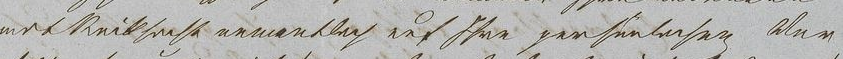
mit Rücksicht namentlich auf Ihre persönlichen Ver-
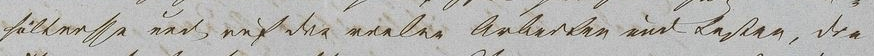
hältnisse und auf die vielen Arbeiten und Lasten, die
